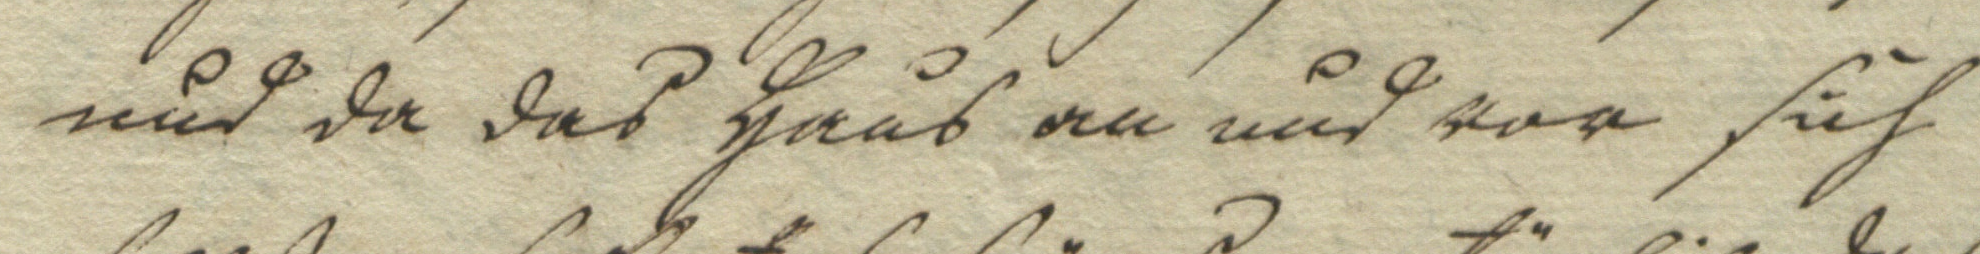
und da das Haus an und vor sich
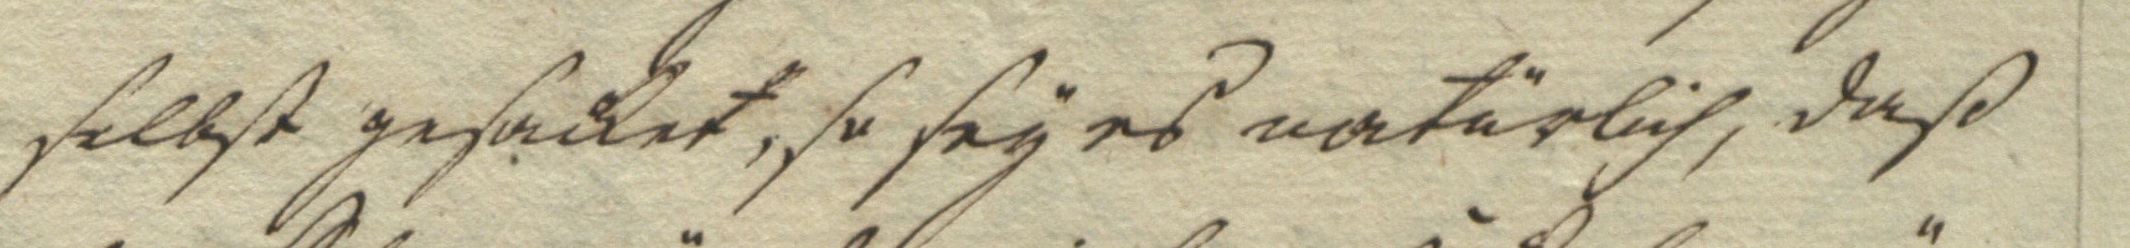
selbst gesacket, so seÿ es natürlich, daß
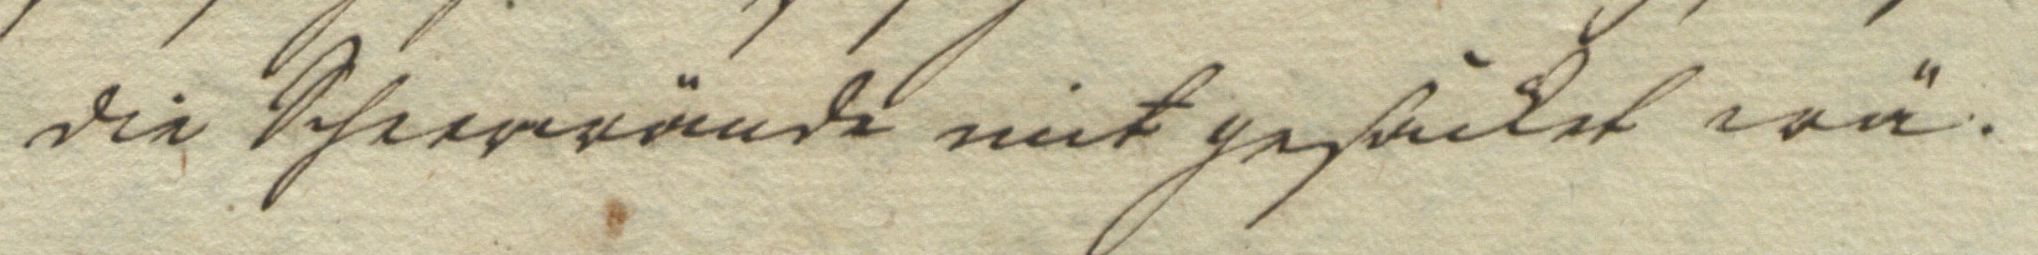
die Scheerwände mit gesacket wä¬
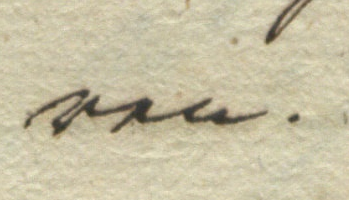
ren.
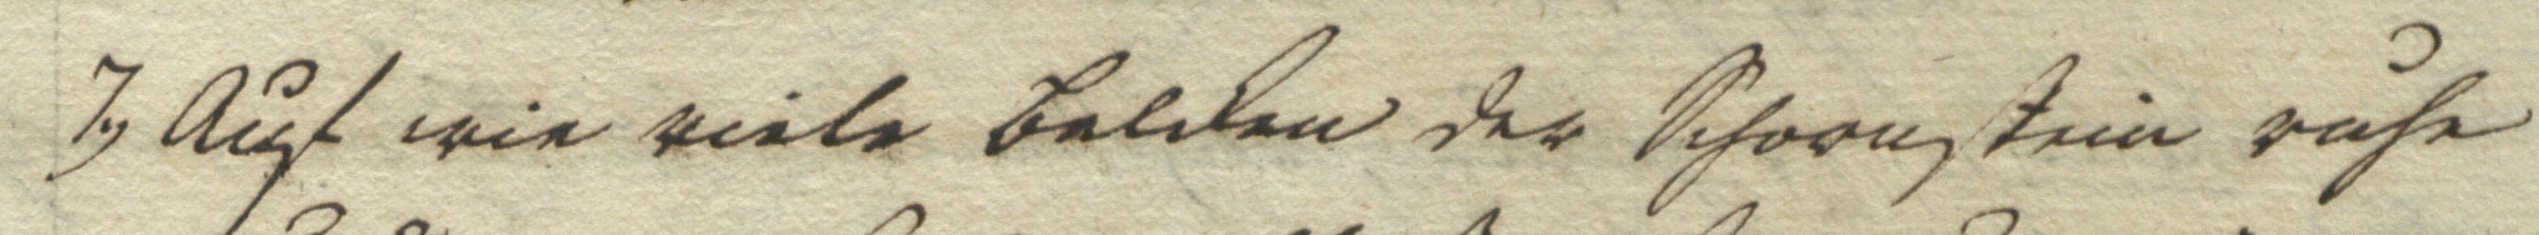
7. Auf wie viele Balcken der Schornstein ruhe
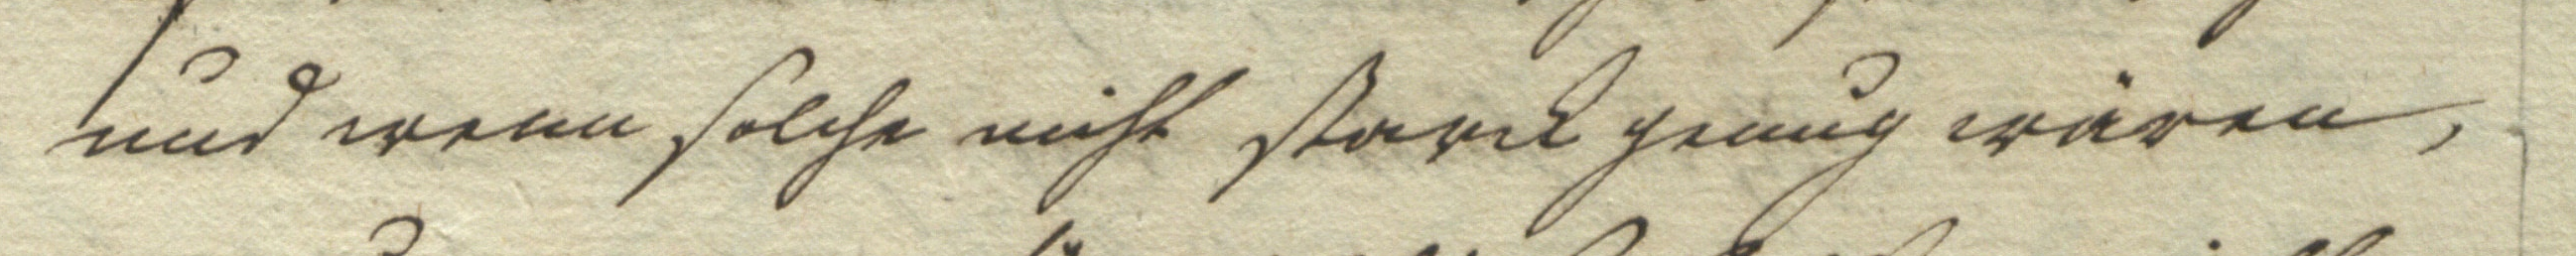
und wenn solche nicht starck genug wären,
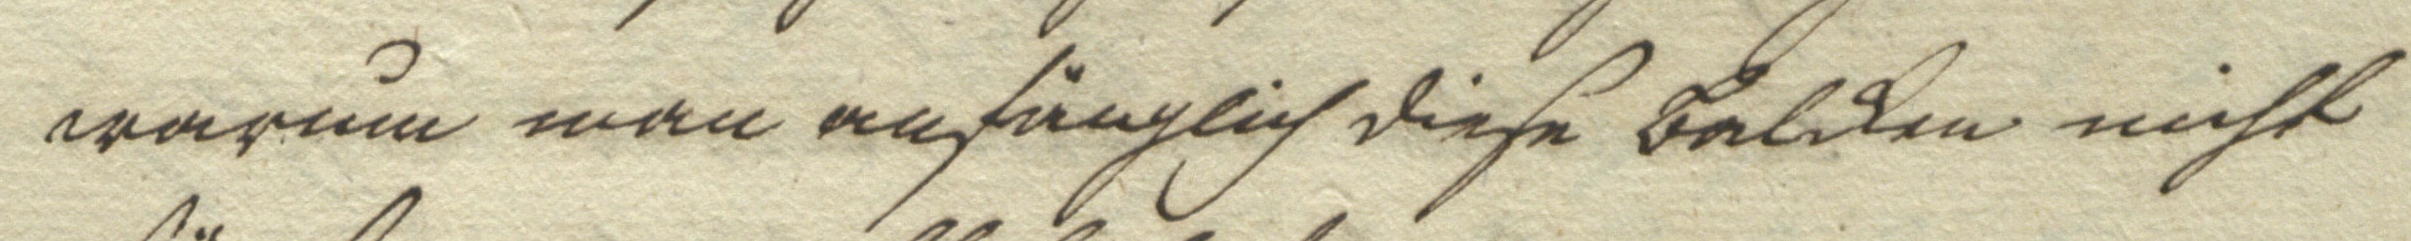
warum man anfänglich diese Balcken nicht
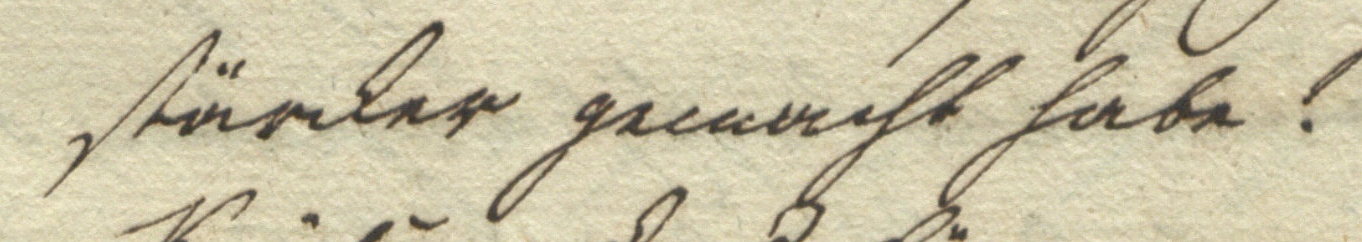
stärcker gemacht habe?
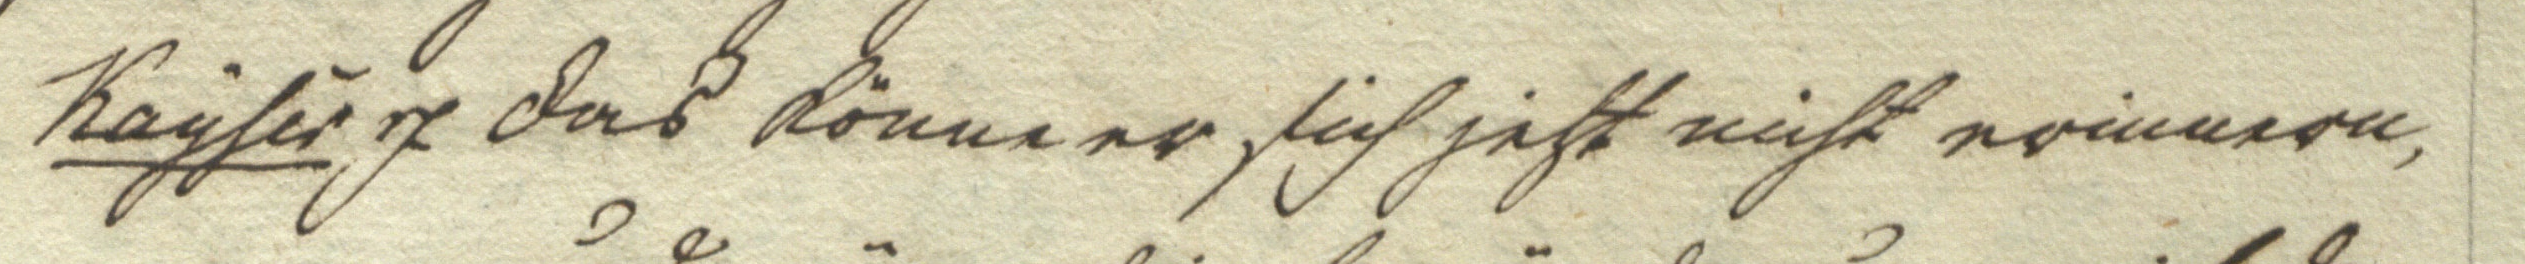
Kaÿser rf Das könne er sich jetzt nicht erinnern,
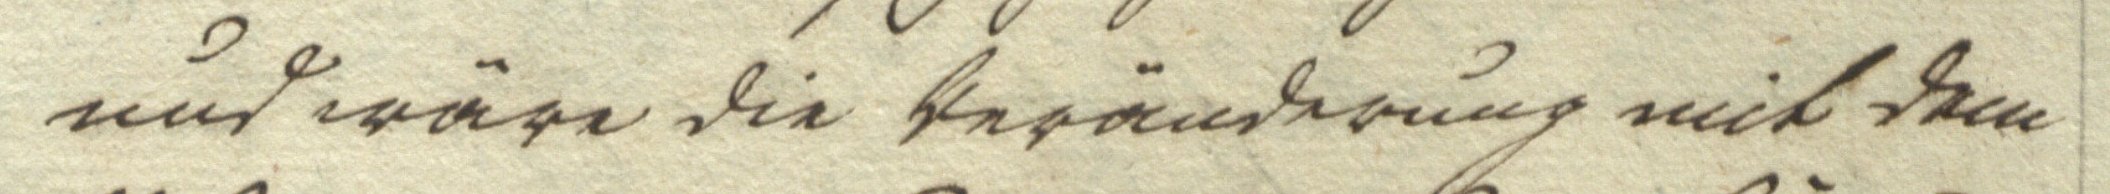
und wäre die Veränderung mit dem
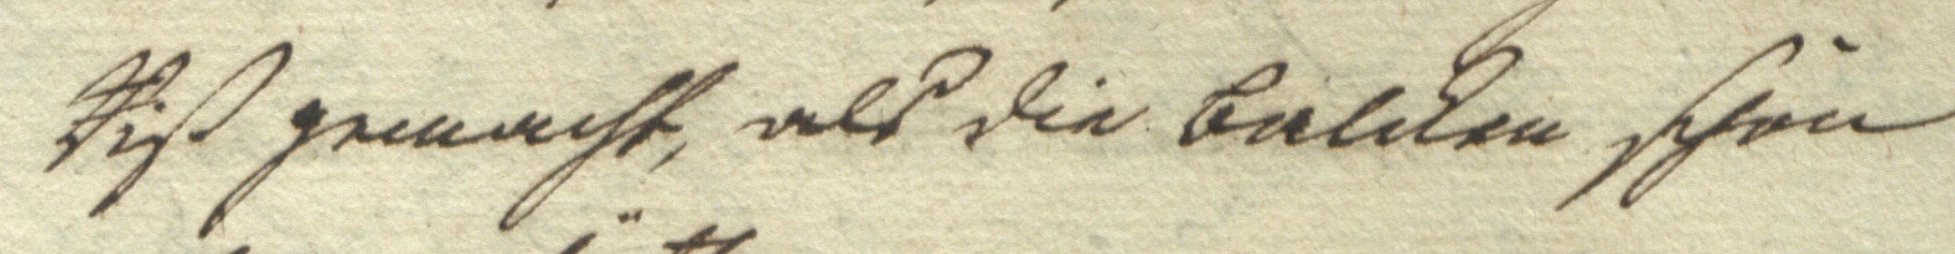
Riß gemacht, als die Balcken schon
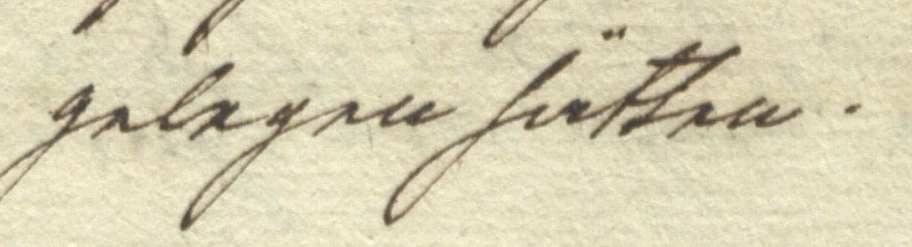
gelegen hätten.
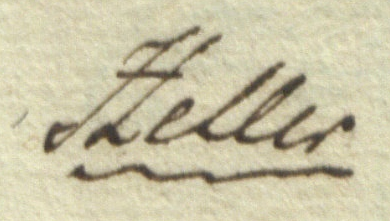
Heller
